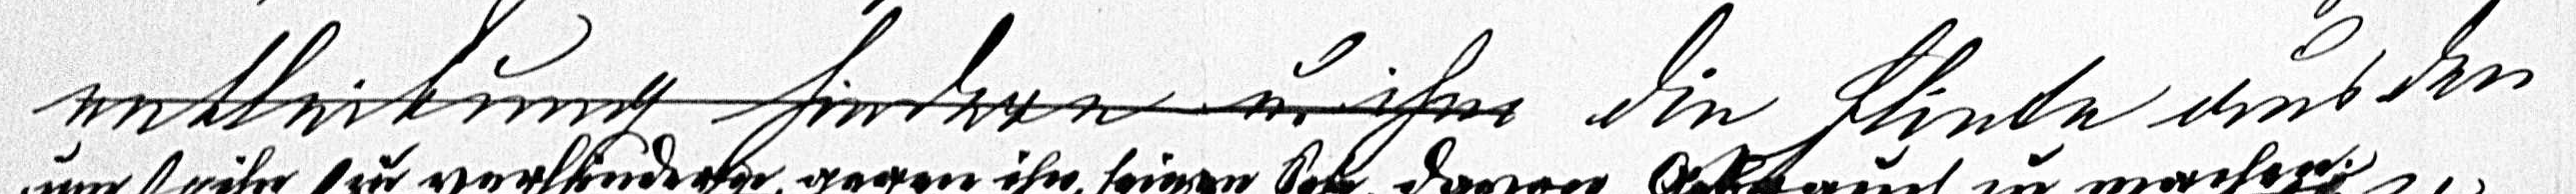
entleibung hindern u. ihm die Flinte aus den
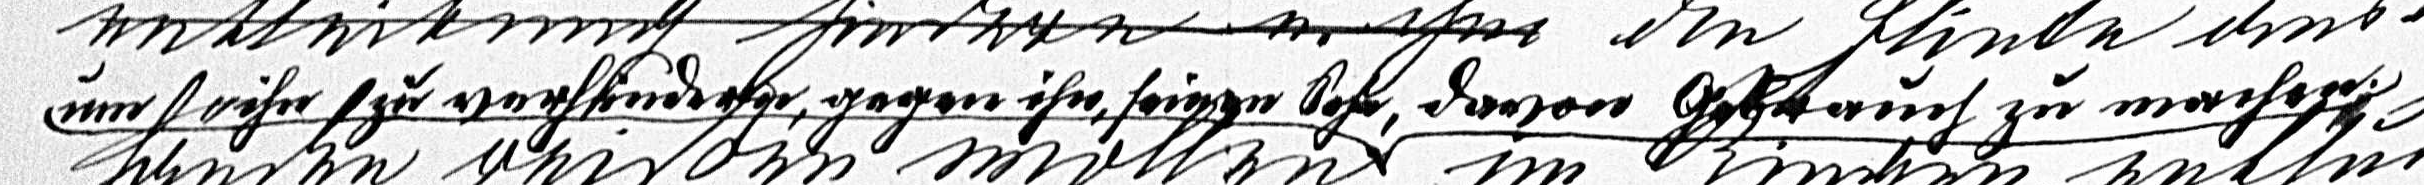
um ihm zu verhindern, gegen ihn, seinen Sohn, davon Gebrauch zu machen,
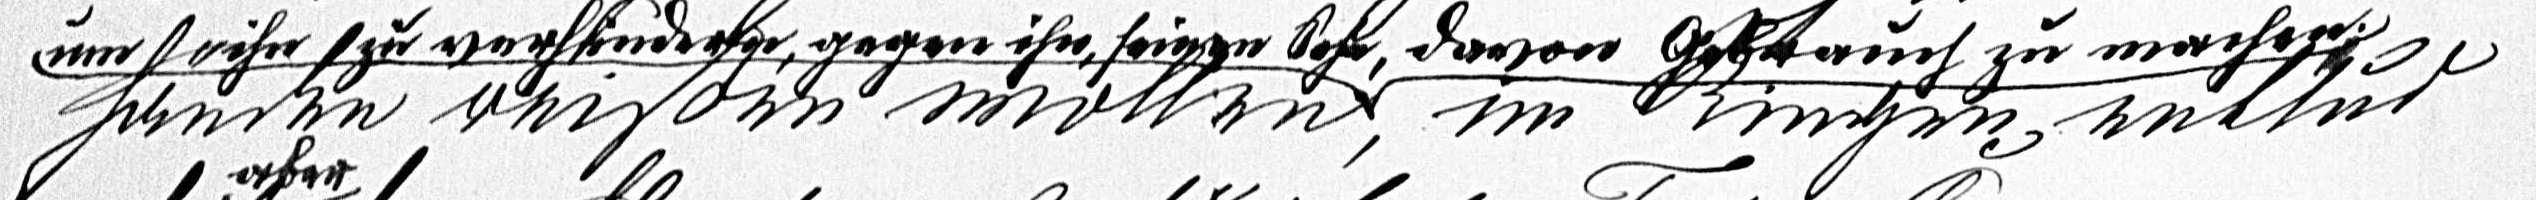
Händen reißen wollen, im Ringen entlud
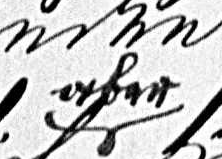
Aber
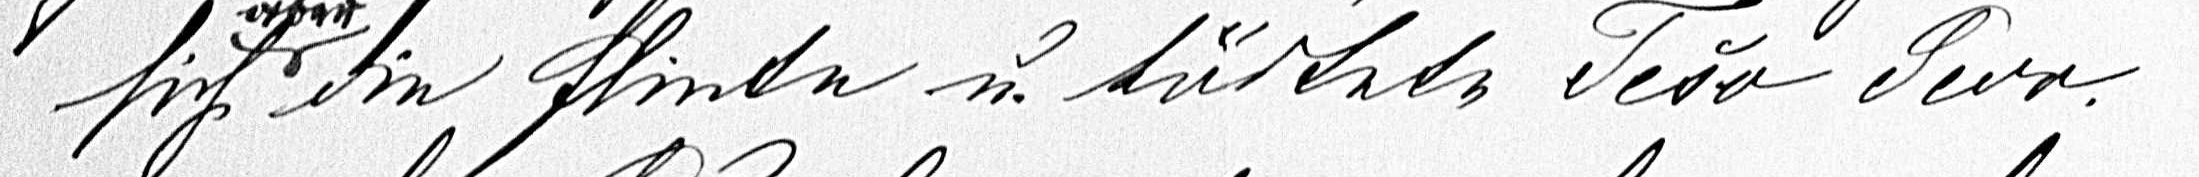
sich die Flinte u. tödtete Tešo Ševo.
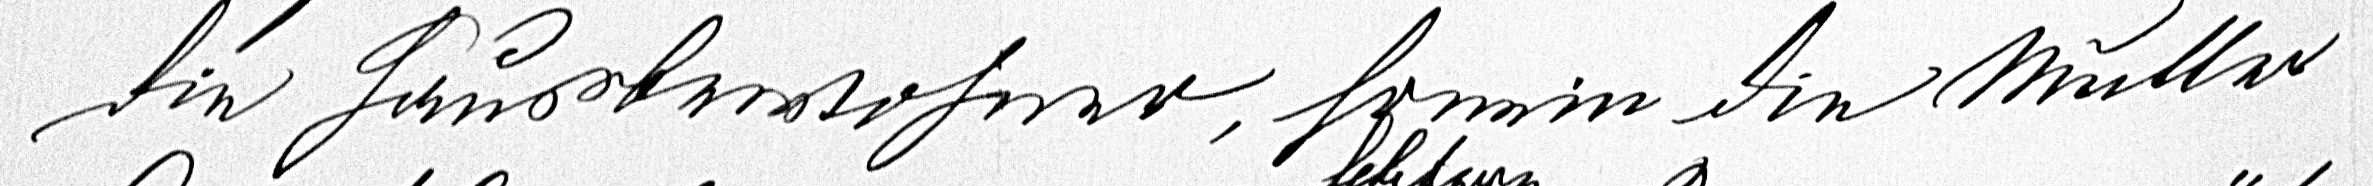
Die Hausbewohner, sowie die Mutter
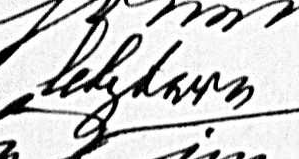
Letztere
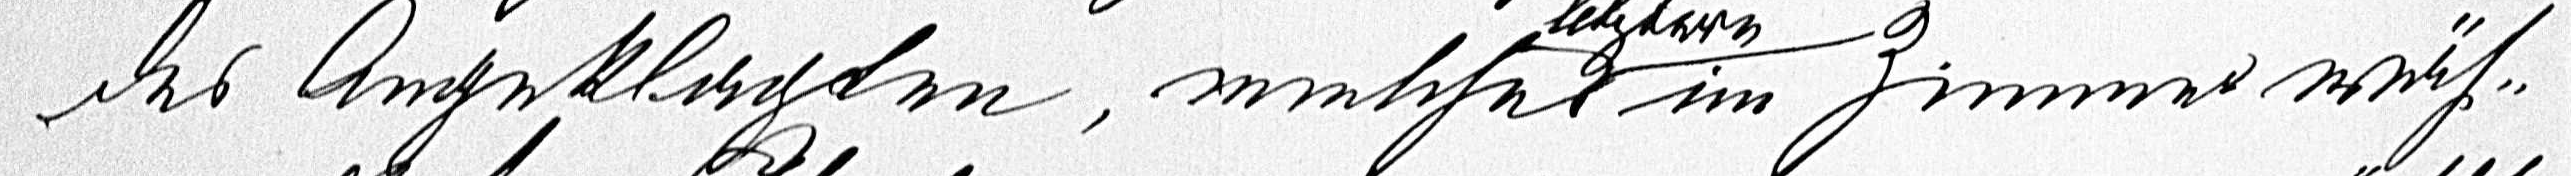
des Angeklagten, welche im Zimmer wäh¬
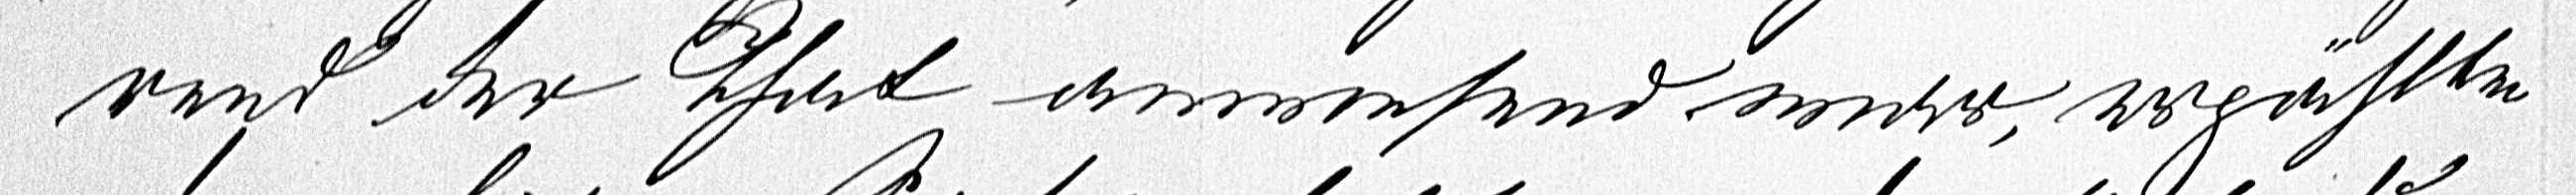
rend der That anwesend war, erzählten
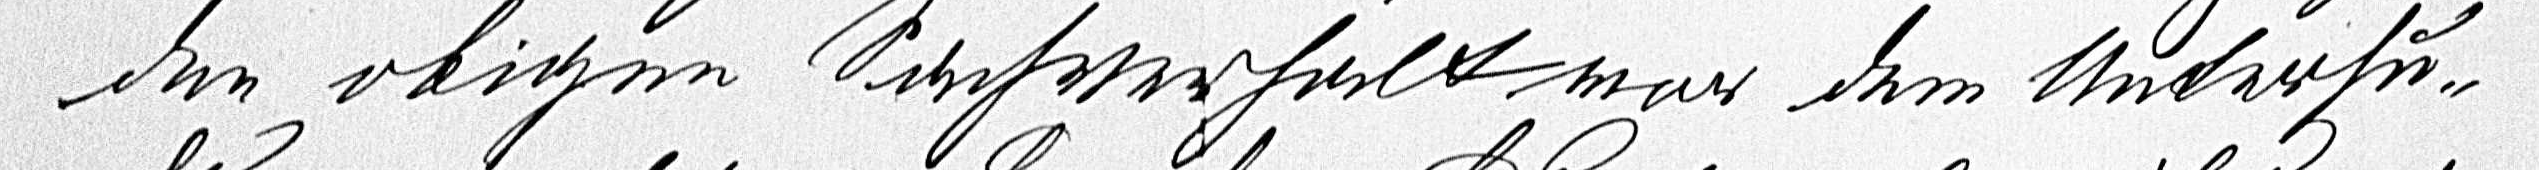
den obigen Sachverhalt vor dem Untersu¬
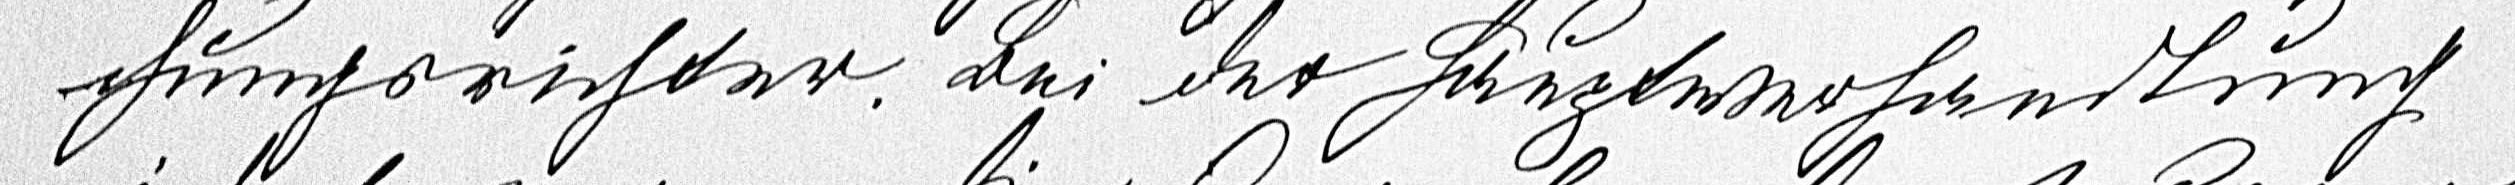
chungsrichter. Bei der Hauptverhandlung
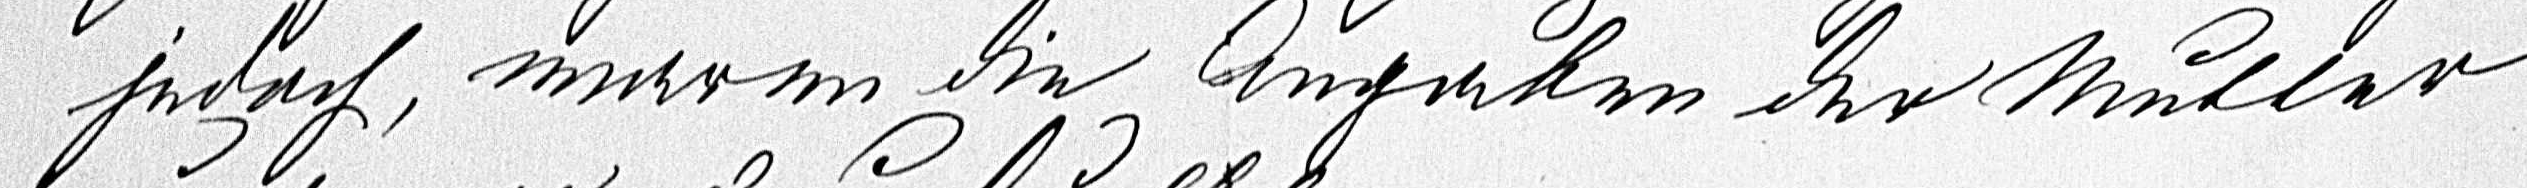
jedoch, waren die Angaben der Mutter
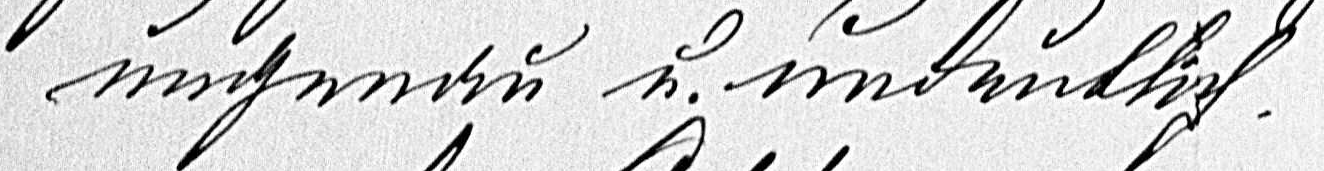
ungenau u. undeutlich.
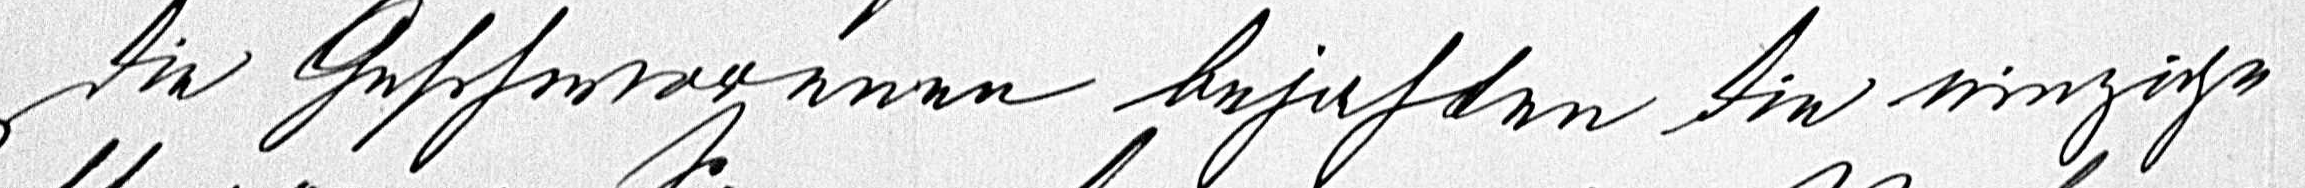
Die Geschworenen bejahten die einzige
